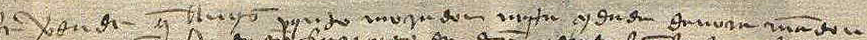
he ꝟdade q̄ lluys pynto morador nesta çydade deuora mādou
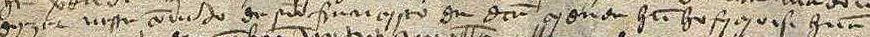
dyzer neste c̄oueto de sā fraçjsco da dcā cydade hū hofyçyo .s. huā
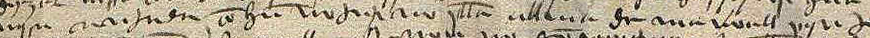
mjsa cantada c̄o hū noturno p̄lla allma de manoell pynto
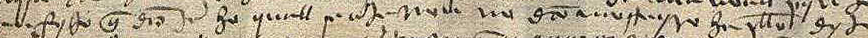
seu fylho q̄ dēs tē ho quall se ēterrou no dc̄o mosteyro he p̄llo dyto
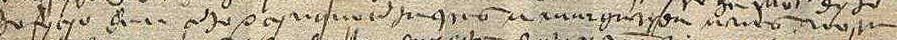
hofyçyo deu çēto e çynquoēta rres a margaryda anes nossa
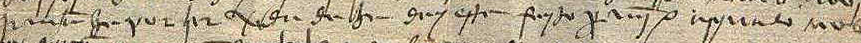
Jrmā he por ser ꝟdade lhe dey este feyto ꝑ mj̄ e asynado aos
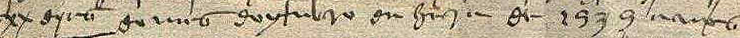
xx dyas do mes doytubro da hera de 1535 anos
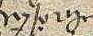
frey Jorge
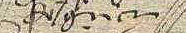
fogaça
